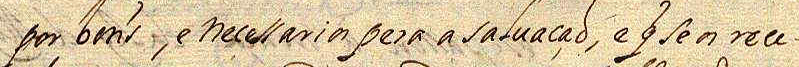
por bons̄, e neçessarios pera a saluaçaõ, e q̄ se os rece
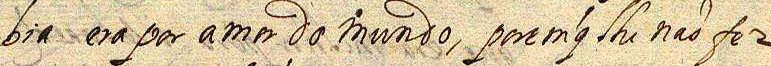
bia era por amor do mundo, porem q̄ lhe naõ fez
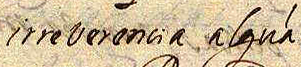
irreverencia alguā.
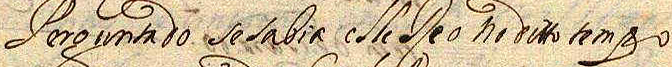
Perguntado se sabia elle Reo no ditto tempo
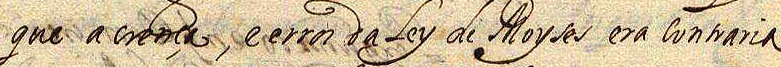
que a crença, e erros da Ley de Moyses era contraria
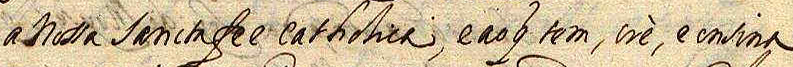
a nossa sancta fee catholica, e ao q̄ tem, crè, e ensina
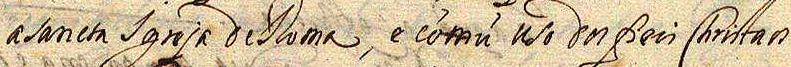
a sancta Igreja de Roma, e cōmū uso dos fieis Christaos.
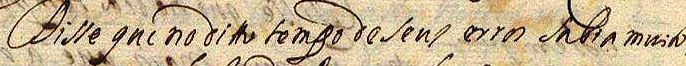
Disse que no ditto tempo de seus erros sabia muito
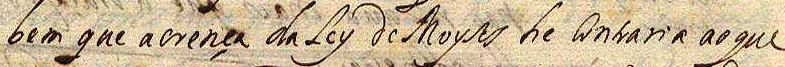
bem que a crença da Ley de Moyses he contraria ao que
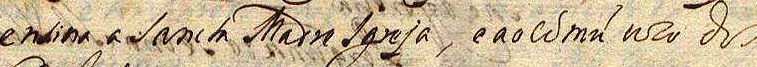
ensina a sancta Madre Igreja, e ao cōmū uzo dos
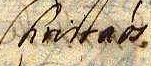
Christaõs.
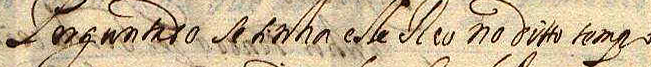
Perguntado se tinha elle Reo no ditto tempo
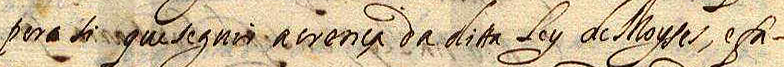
pera si que seguir a crença da ditta Ley de Moyses, e fa
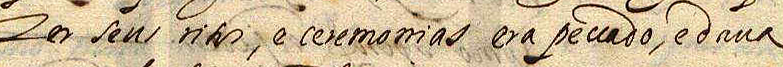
zer seus ritos, e ceremonias era peccado, e daua
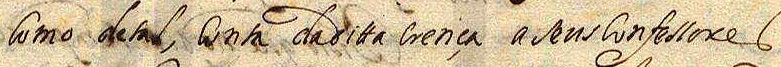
como de tal, conta da ditta crença a seus confessores
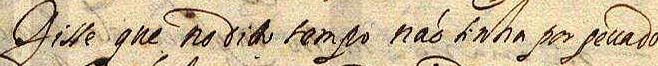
Disse que no ditto tempo naõ tinha por peccado
